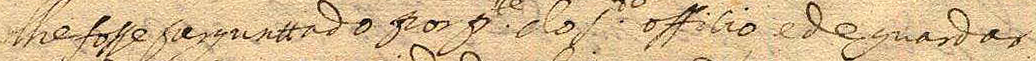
lhe fosse pergunttado por pte. do sto. officio, e de guardar
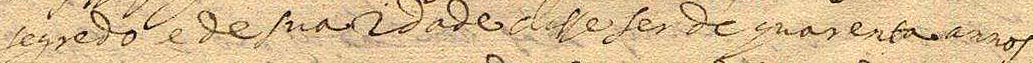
segredo, e de sua idade disse ser de quarenta annos
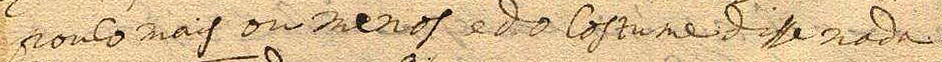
pouco mais ou menos, e do costume disse nada.
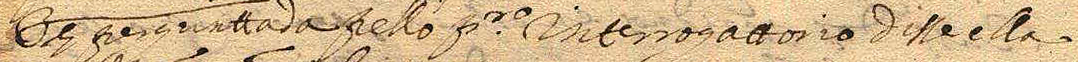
item E pergunttada pello pro. interrogattorio disse ella
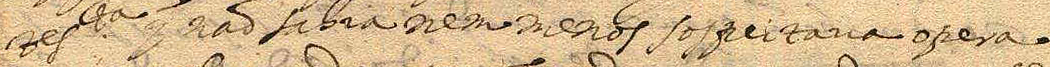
testa. q̄ naõ sabia nem menos sospeitaua o pera
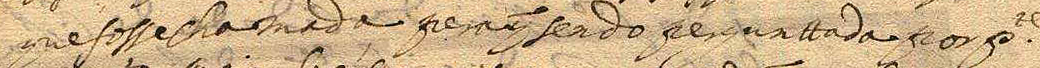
que fosse chamada, pera q̄ sendo pergunttada por pte.
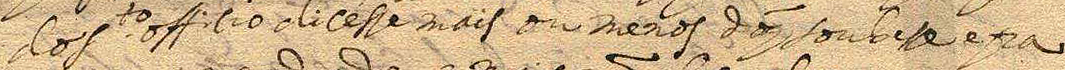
do sto. officio dicesse mais ou menos do q̄ soubesse e pa
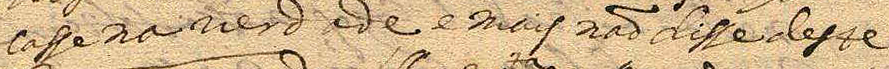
casse na uerdade, e mais não disse deste.
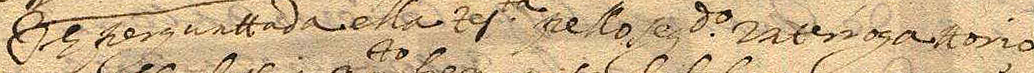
item E pergunttada ella testa. pello segdo. interrogarrorio
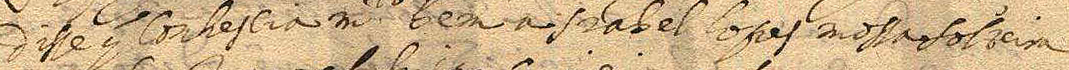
disse q̄ conhescia mto. bem a Jzabel lopes mossa solteira
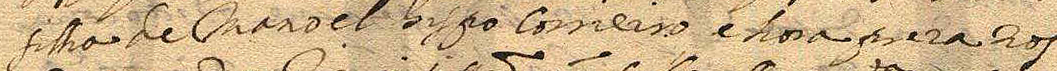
filha de Manoel bispo corrieiro, e hora preza nos
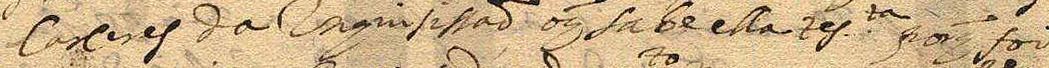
Carceres da Inquisissão, o q̄ sabe ella tes.ta porq̄ foi
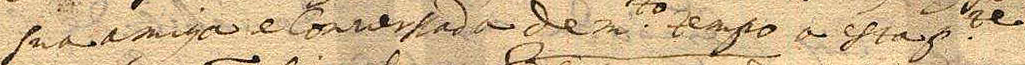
sua amiga e conuerssada de mto. tempo a esta p.te
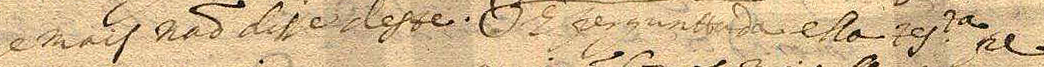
e mais não disse deste. item E pergunttada ella testa. pe
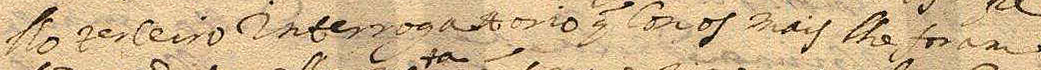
llo terceiro Interrogattorio q̄ con os mais lhe foram
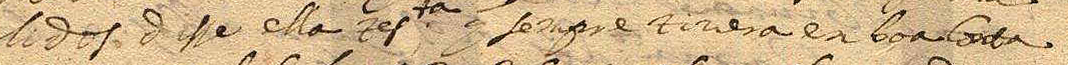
lidos disse ella testa; q̄ sempre tiuera en boa Conta
